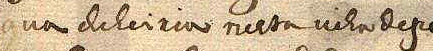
qua de leiria nesta uila de pe
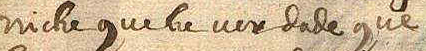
niche que he uerdade que
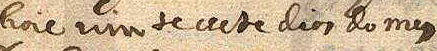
hoie uinte e sete dias do mes
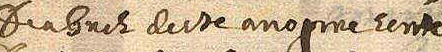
De abril deste ano presente
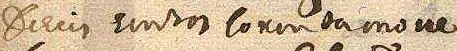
De seissentos Corenta e noue
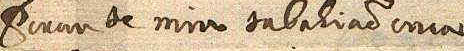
Perante mm tabaliaõ en ca
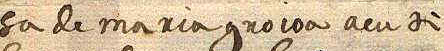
sa de maria groioa a cuti
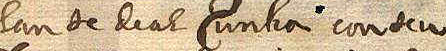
lante de alCunha conteu
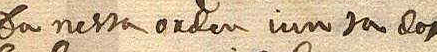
Da nesta onden iunta dos
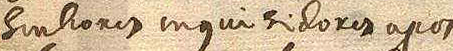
Senhores inquisidores apos
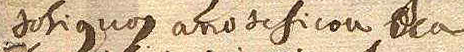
toliquos a noteficou O ca
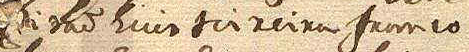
Pitaõ luis teixeira franco
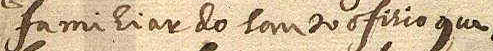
familiar do santo ofisio que
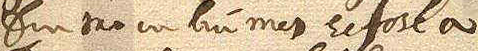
Dentro en hū mes se fose a
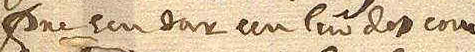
Presentar em huū dos cou
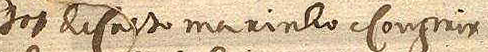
tos de Casto marinho e Conprir
